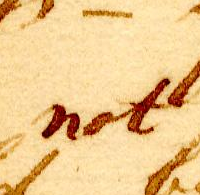not
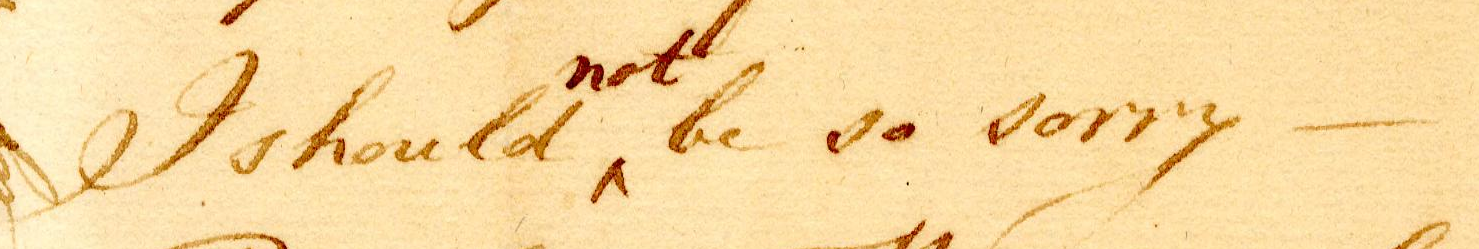I should ^ be so sorry.
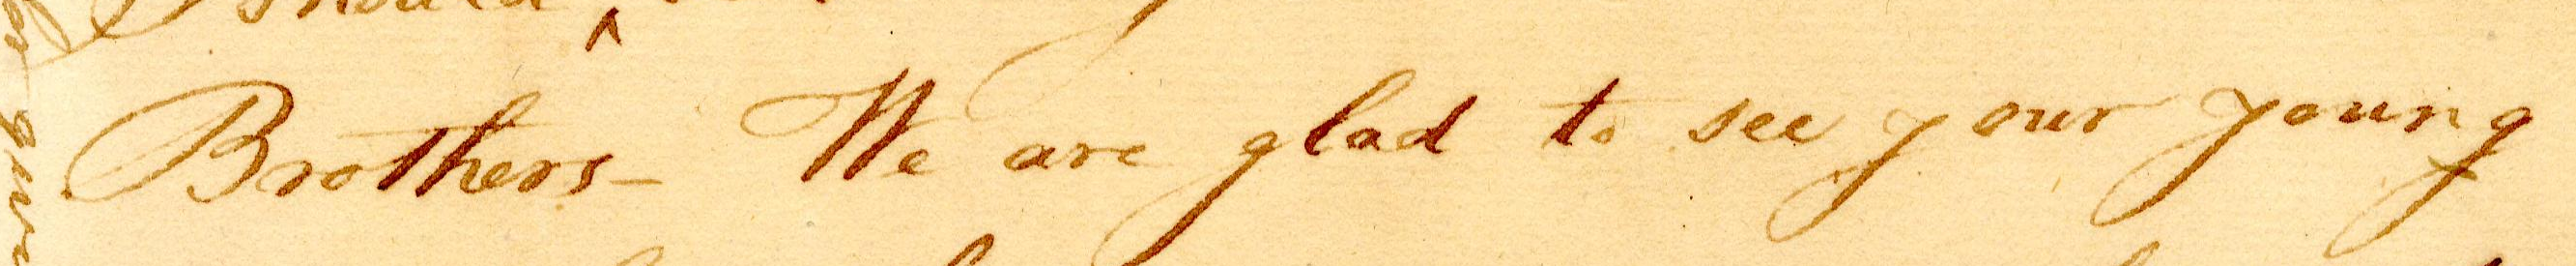Brothers, We are glad to see your young
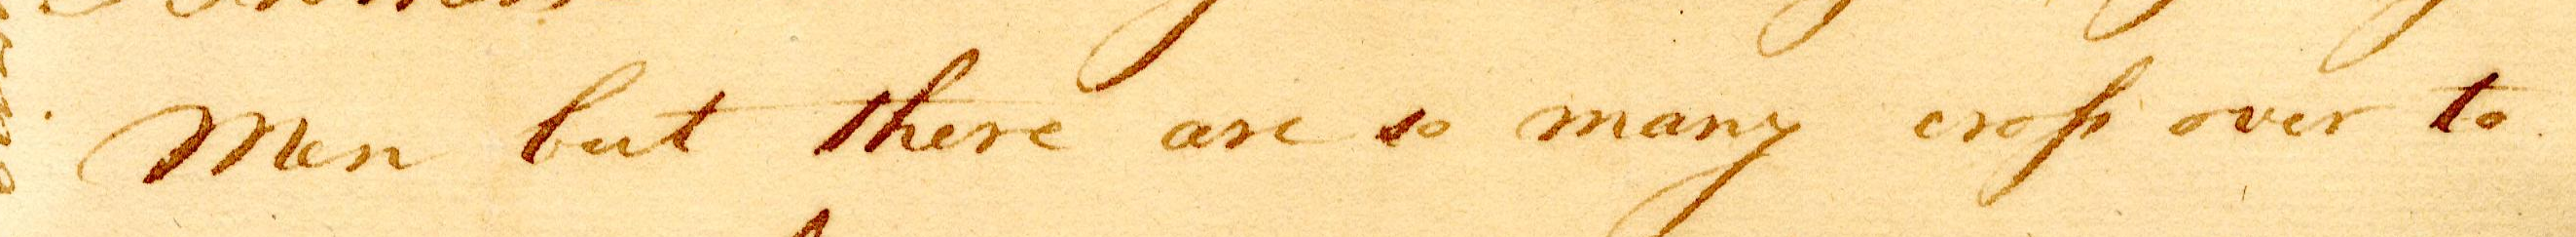Men but there are so many cross over to
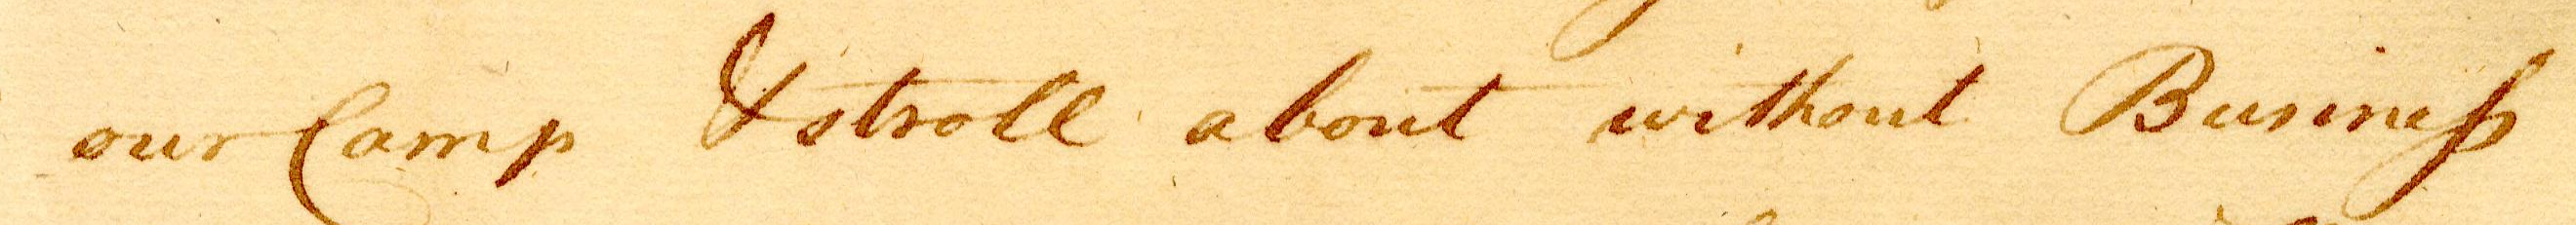our Camp & stroll about without Business
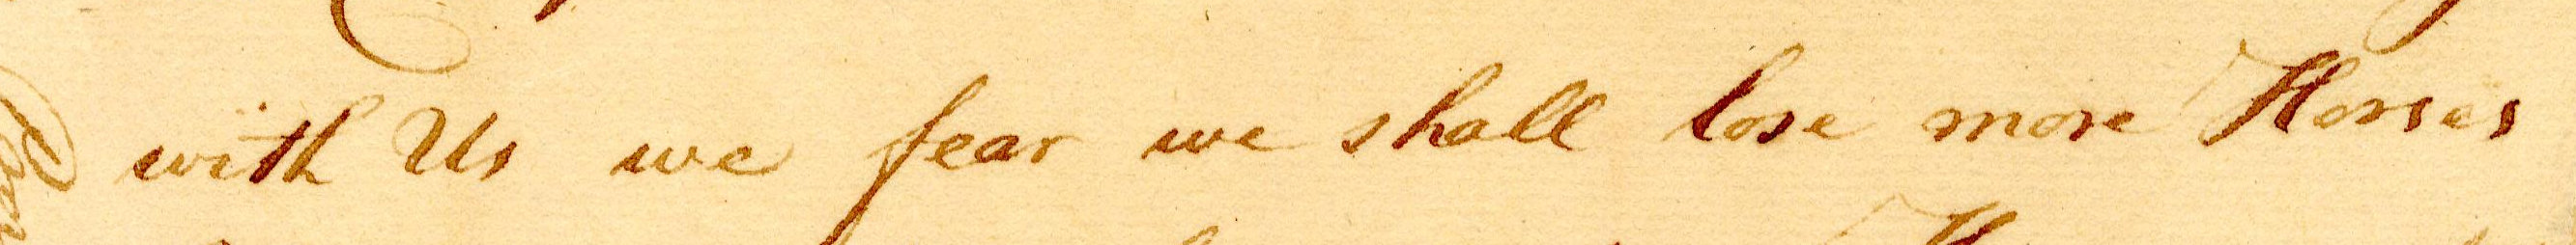with us we fear we shall lose more Horses
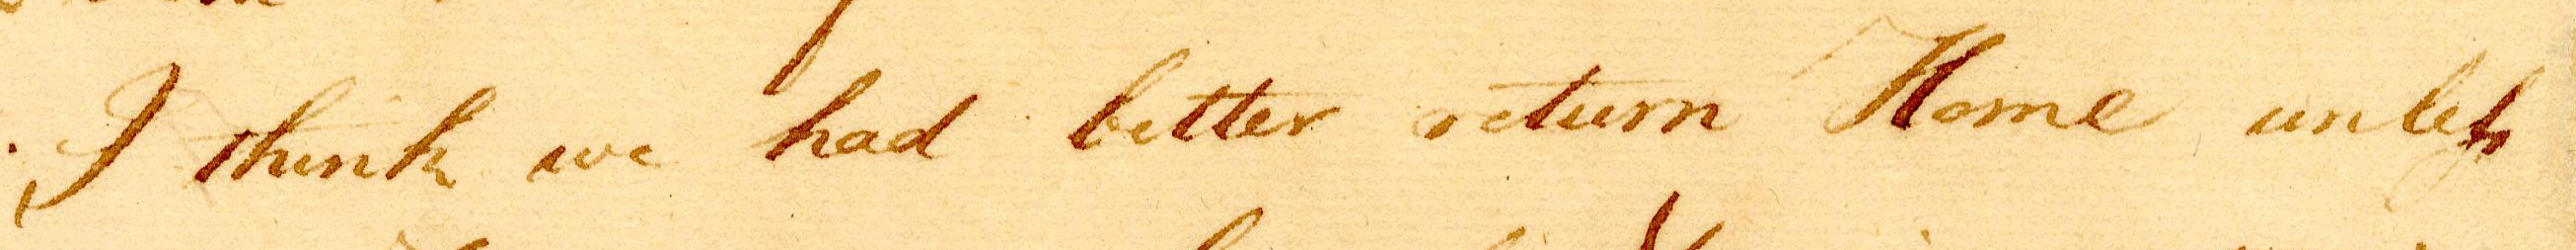I think we had better return Home untill
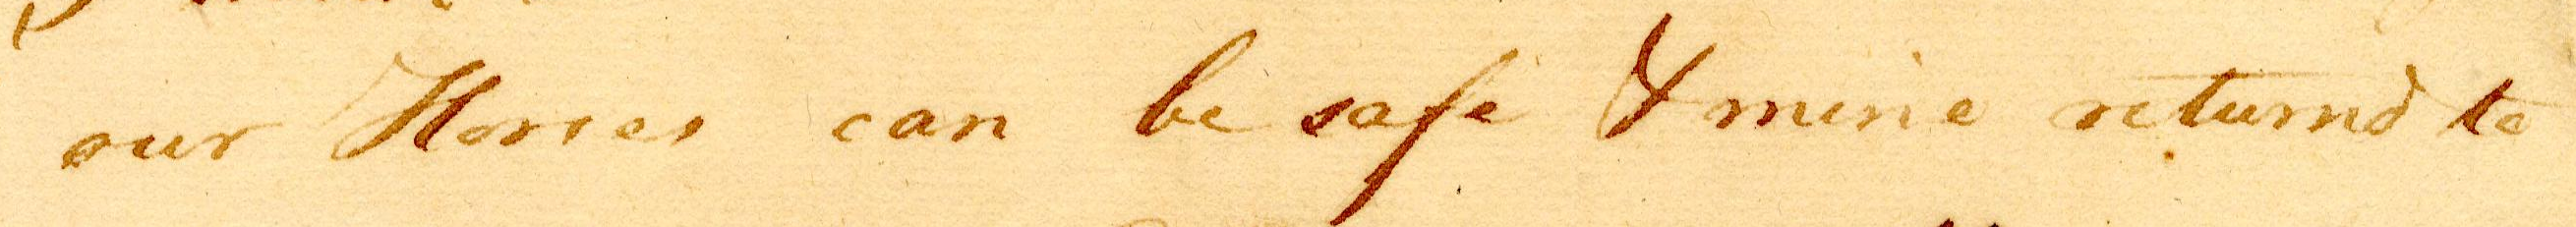our Horses can be safe & mine returnd to
